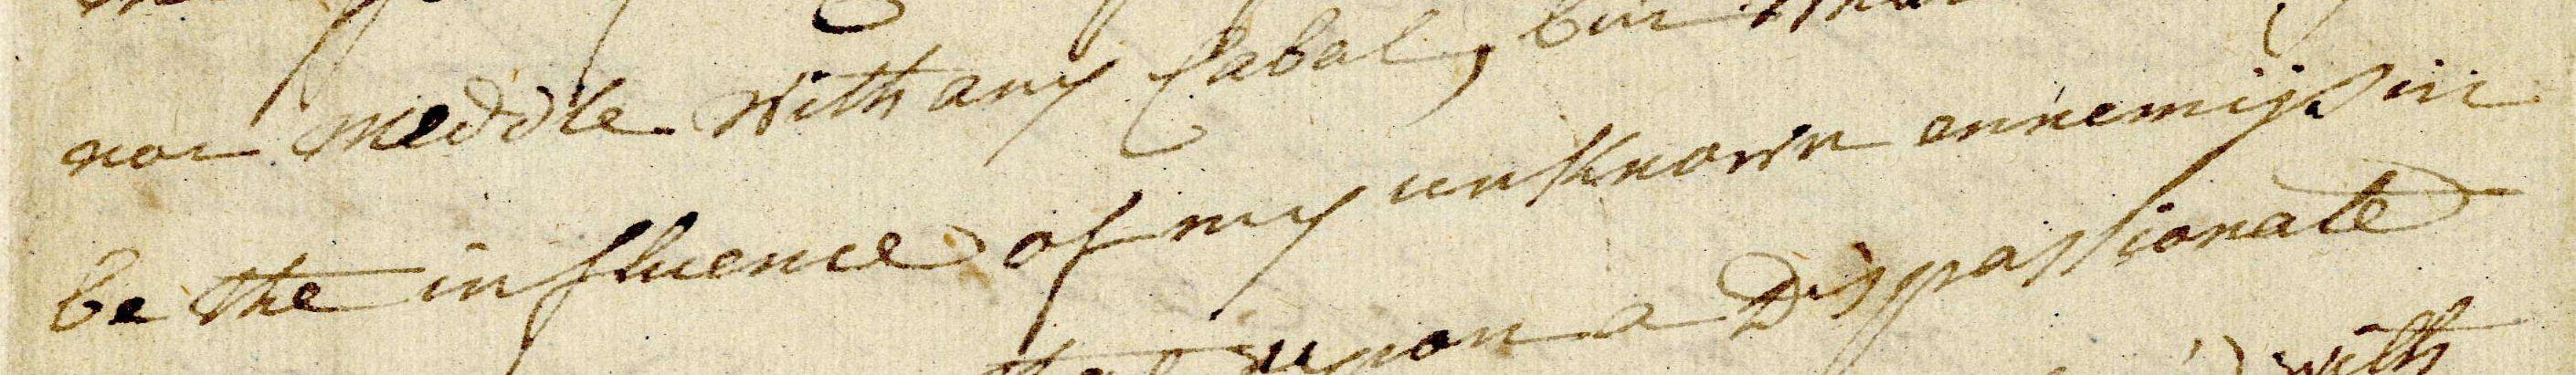be the influence of my unknown enemys in
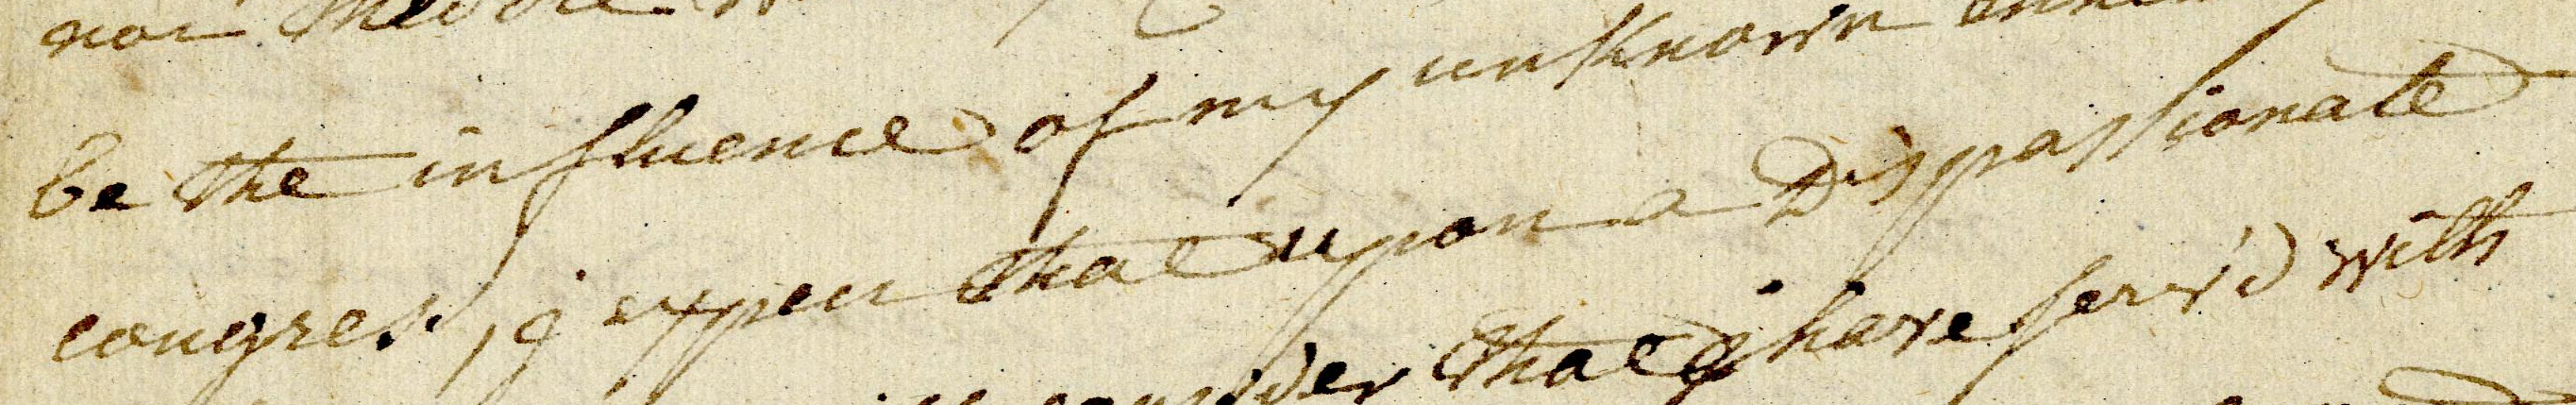congress, I expect that upon a dispassionate
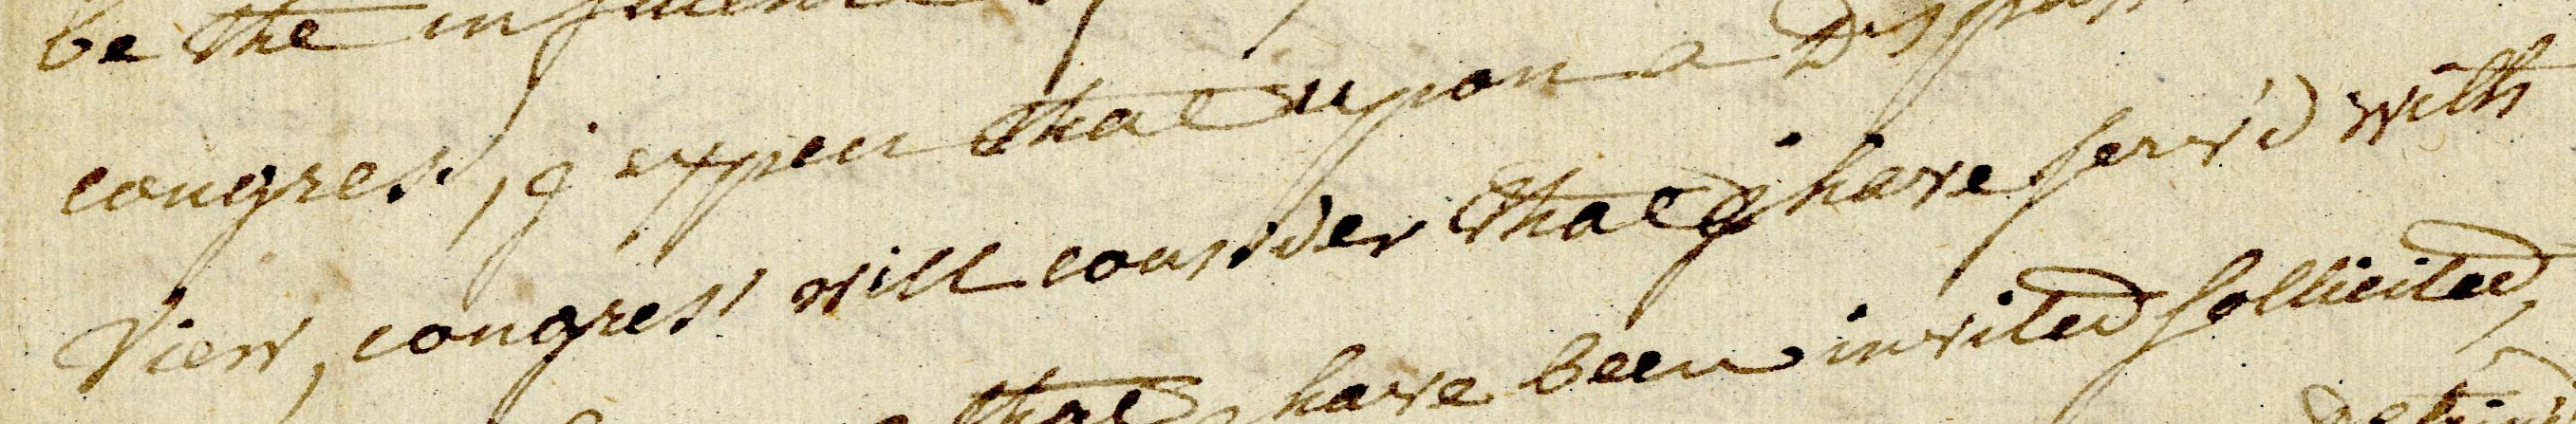View, congress will consider that I have serv'd with
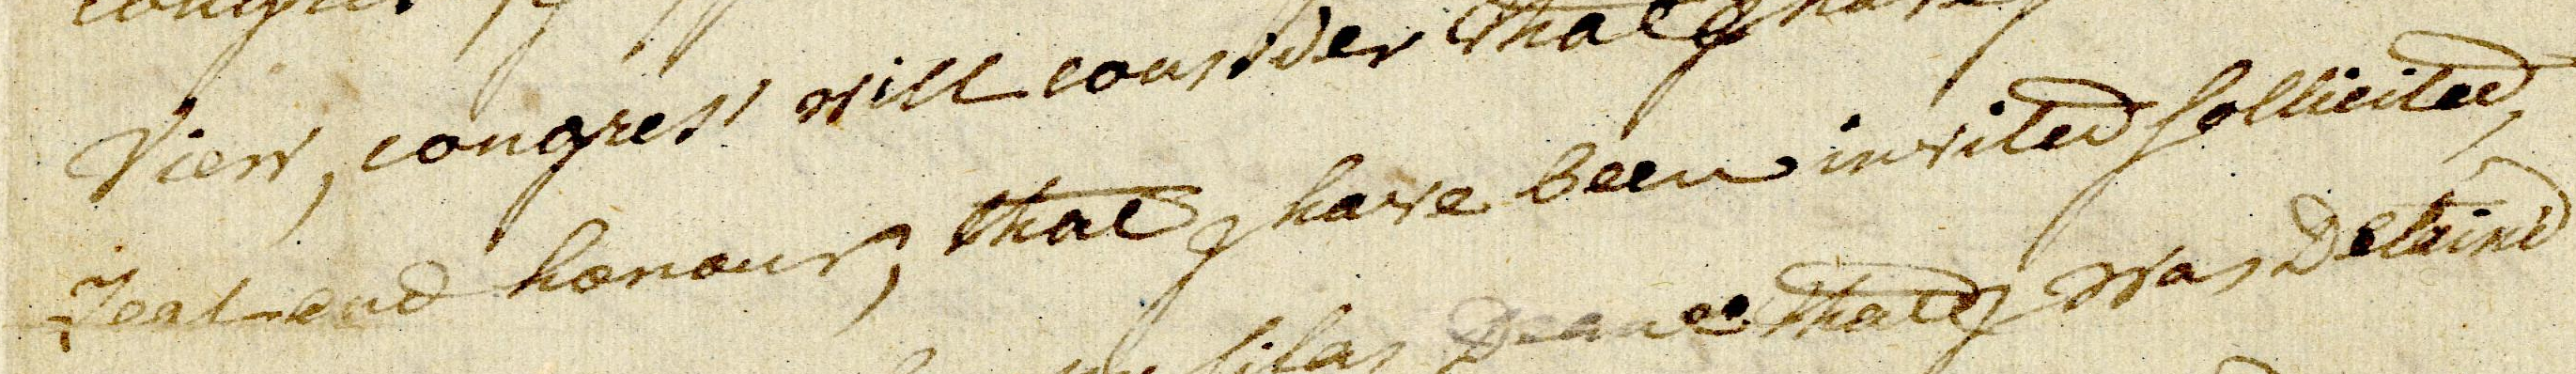zeal and honour, that I have been invited sollicited,
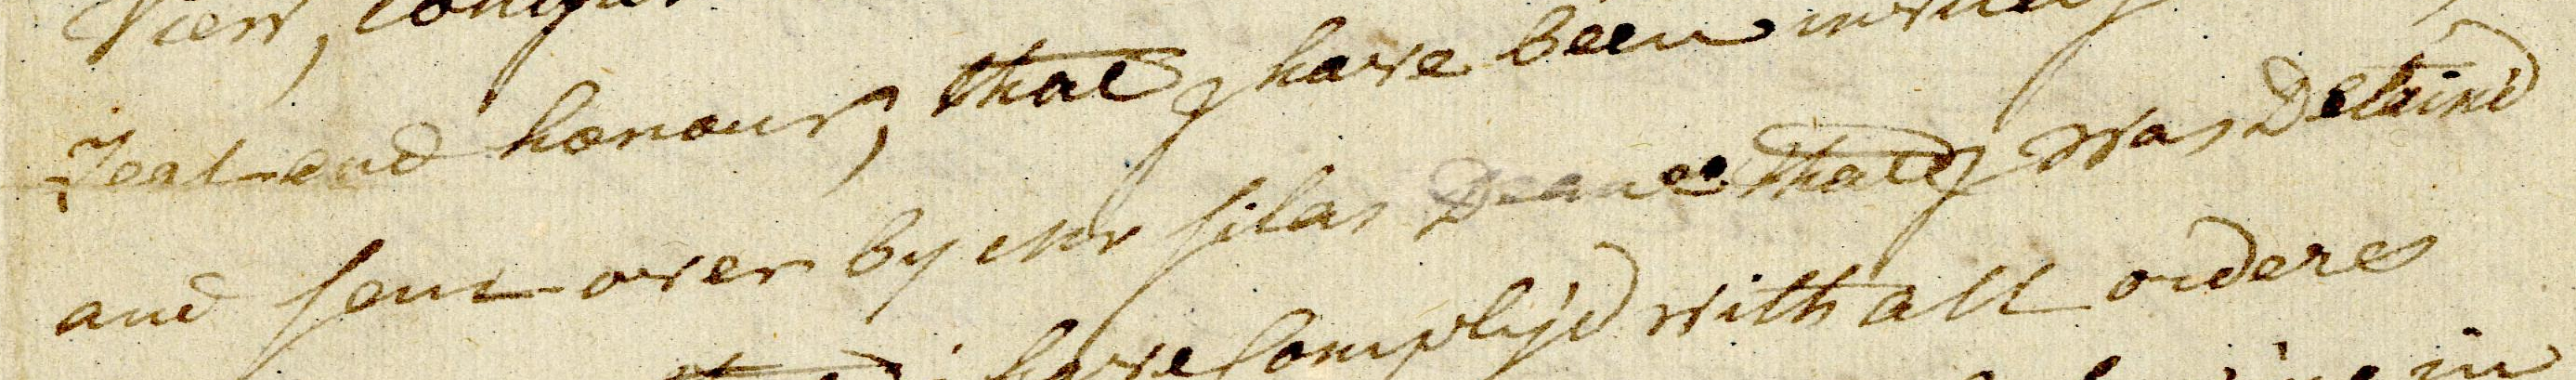and sent over by Mr silas Deane that I was Detaind
